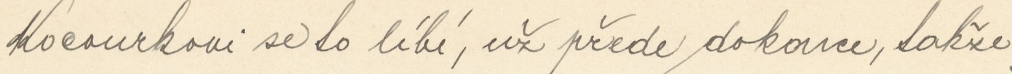Kocourkovi se to líbí, už přede dokonce, takže
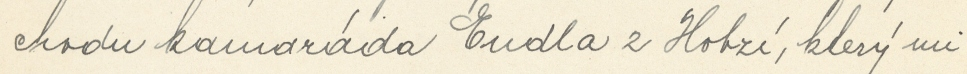chodu kamaráda Endla z Hobzí, který mi
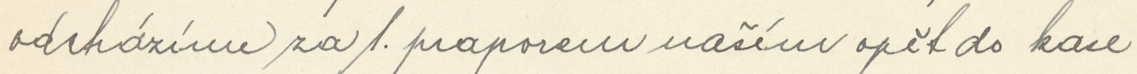odcházíme za 1. praporem naším opět do kase-
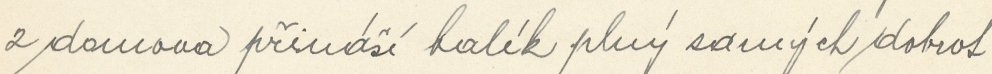z domova přináší balík plný samých dobrot
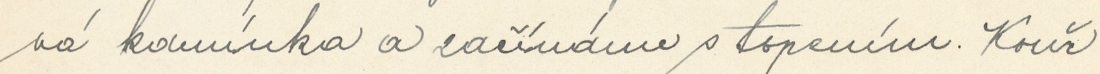vá kamínka a začínáme s topením. Kouř
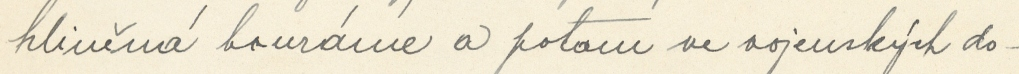hliněná bouráme a potom ve vojenských do-
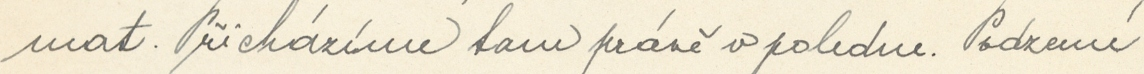mat. Přicházíme tam právě v poledne. Podzemí
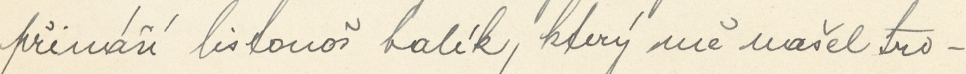přináší listonoš balík, který mě našel tro-
